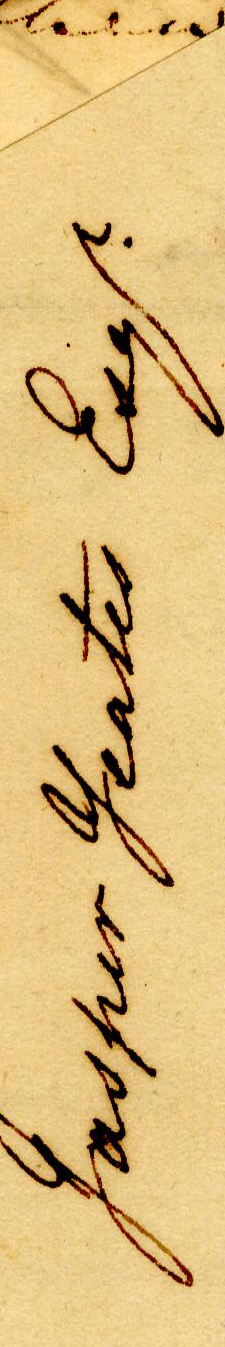Jasper Yeates Esq^r
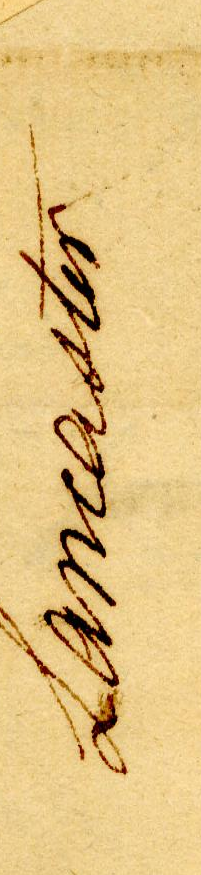Lancaster
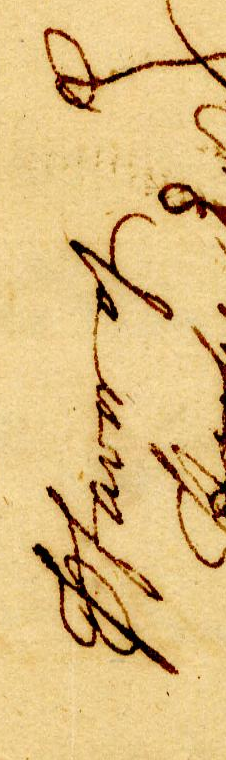Per favor of
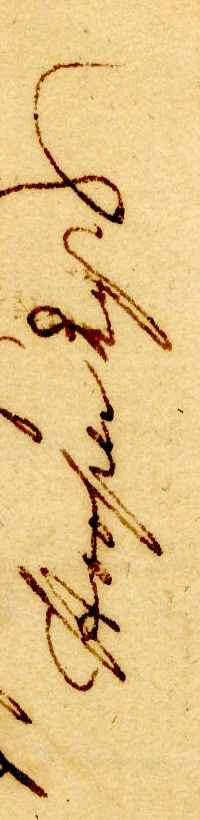Hooper Esq^r.
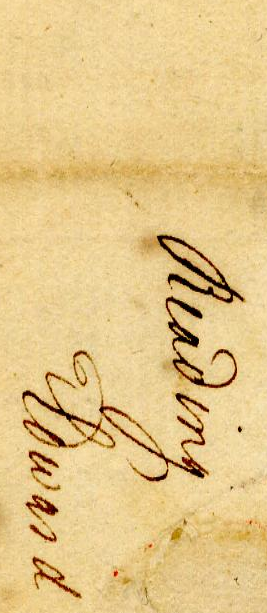Reading
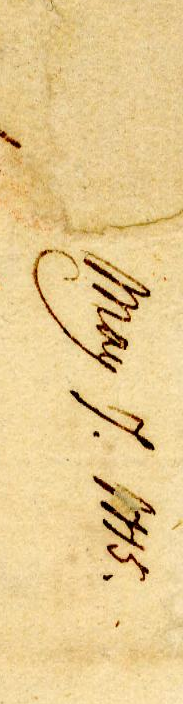May 7. 1775
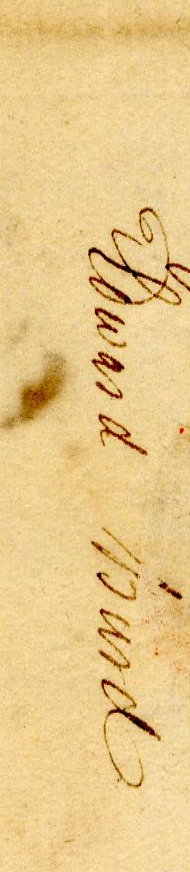Edward Burd
